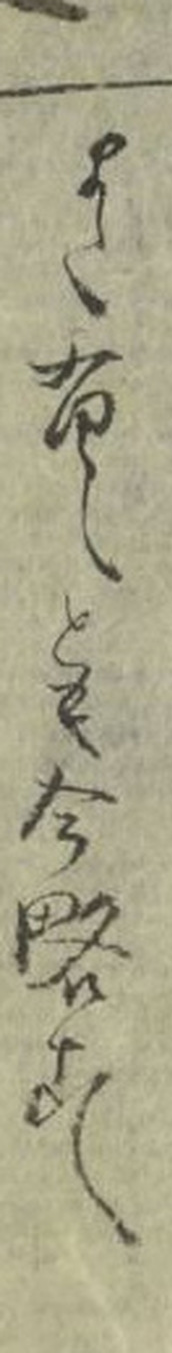また有しとも今略す
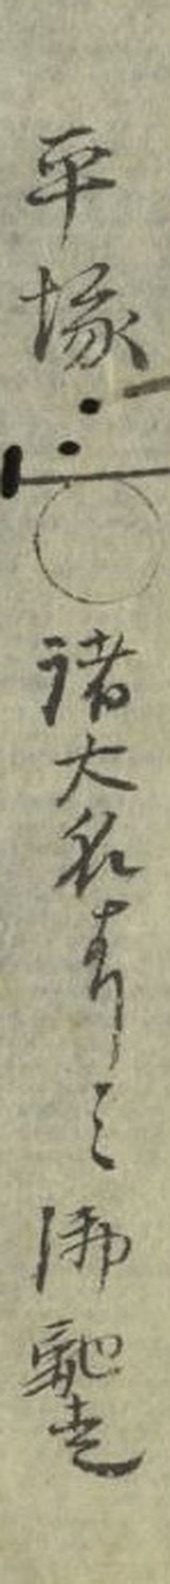○諸大名より之御馳走
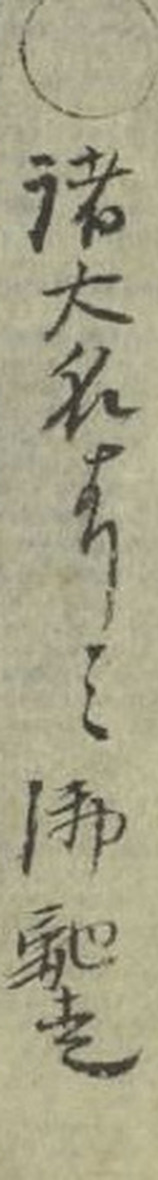○諸大名より之御馳走
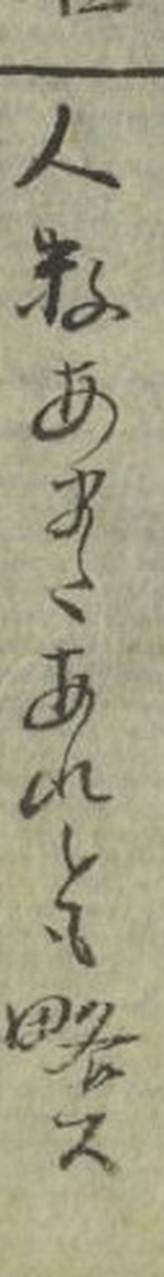人数あまたあれとも略ス

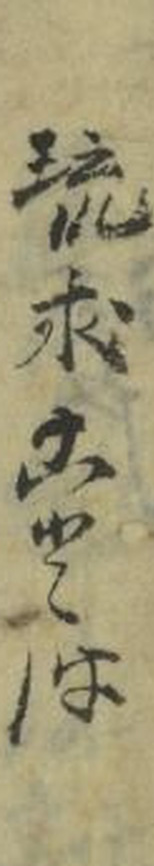琉球ことは
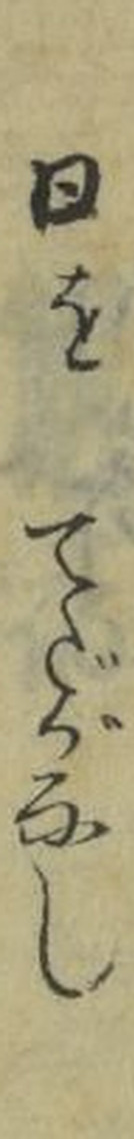日をてだがなし
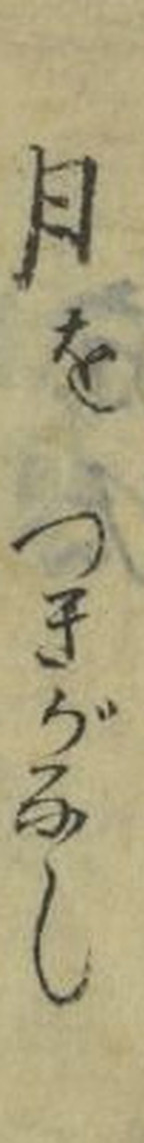月をつきがなし
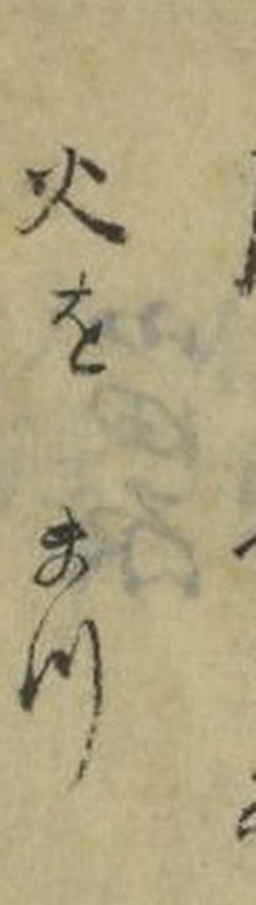火をまつ
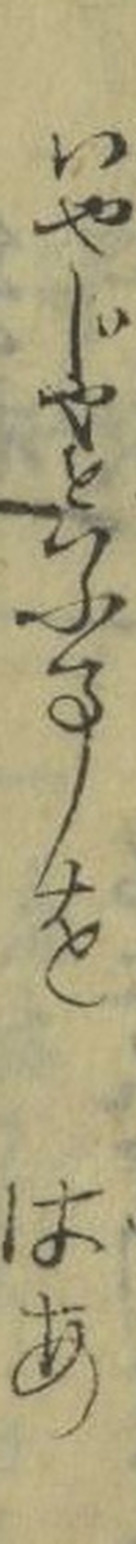いやじやといふ事をばあ
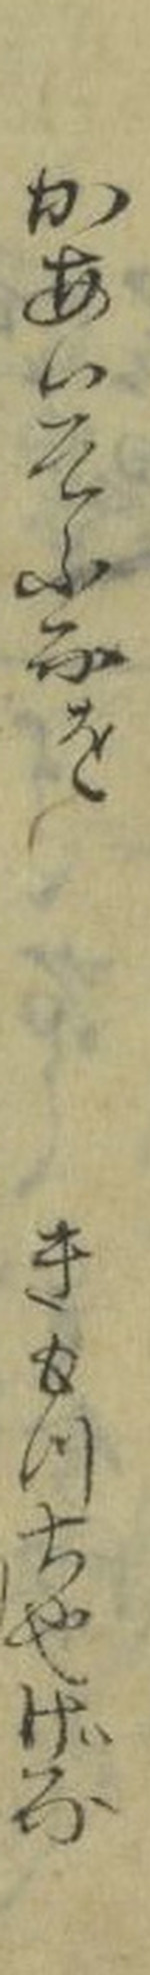かあいそふなをきもつちやげな
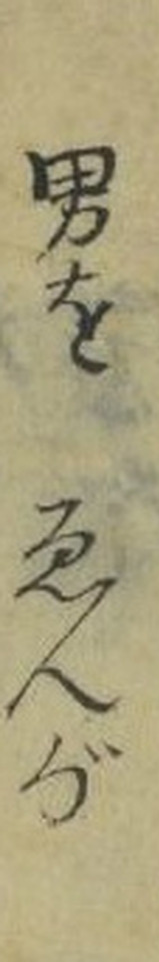男をゑんが
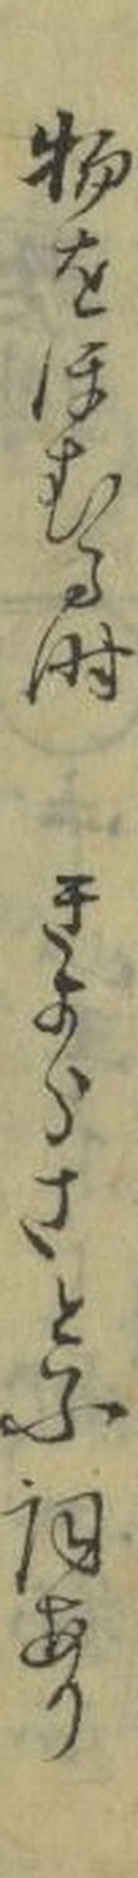物をほむる時きよらさといふ詞あり
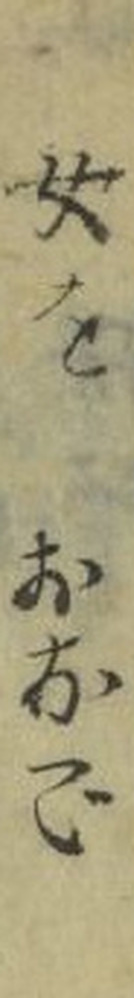女をおなご
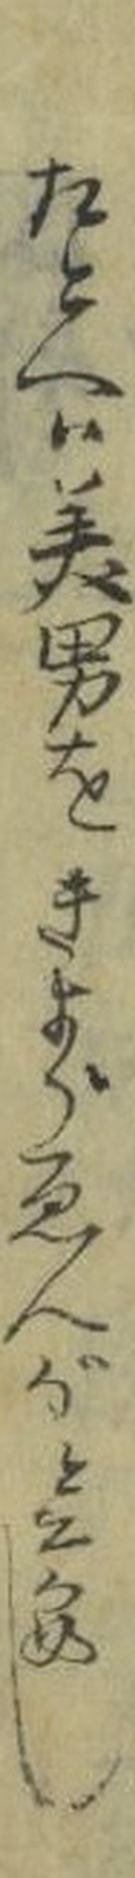たとへは美男をきよらゑんがと云か如し
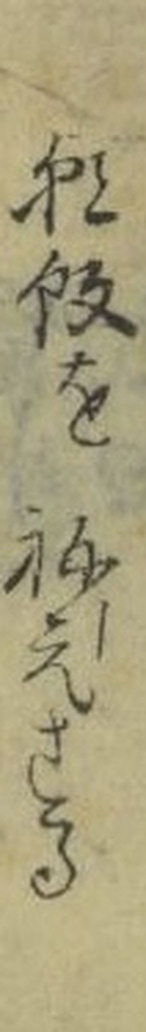朝飯をねーえさる
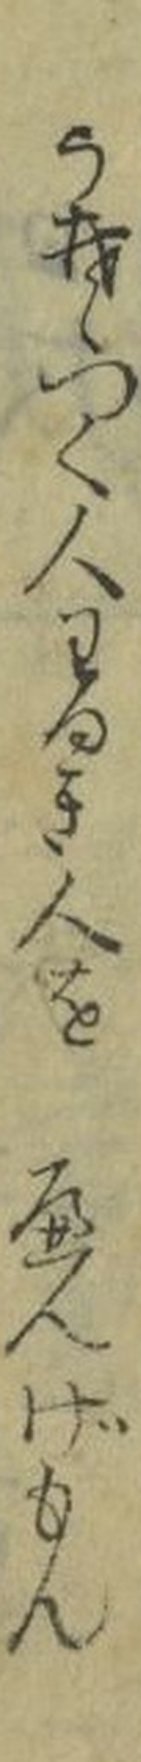うそつく人わるき人をへんげもん
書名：天保三年来朝 琉球人行列記
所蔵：University of the Ryukyus Library
